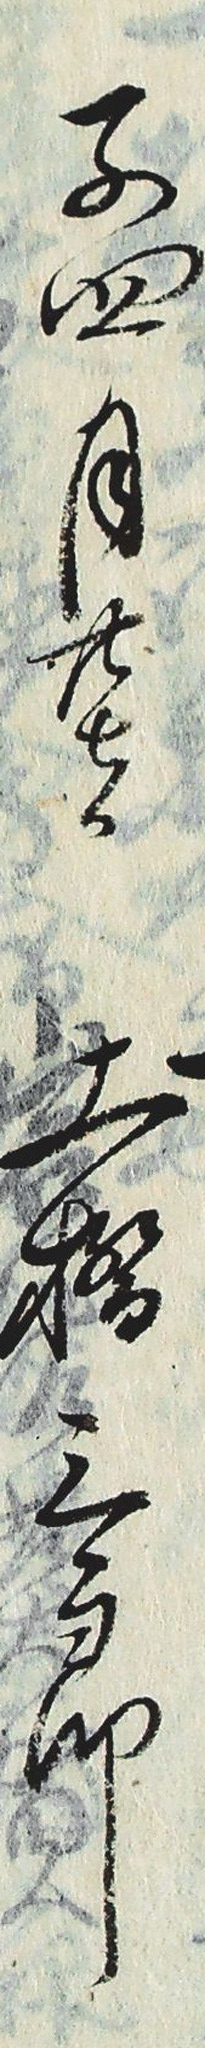子四月廿七日土橋三郎
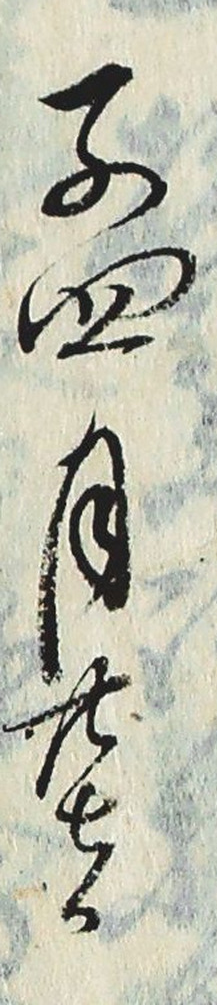子四月廿九日
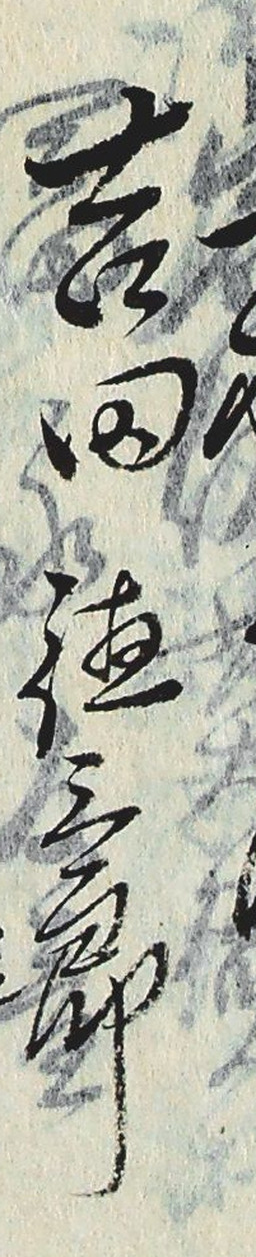吉田徳三郎
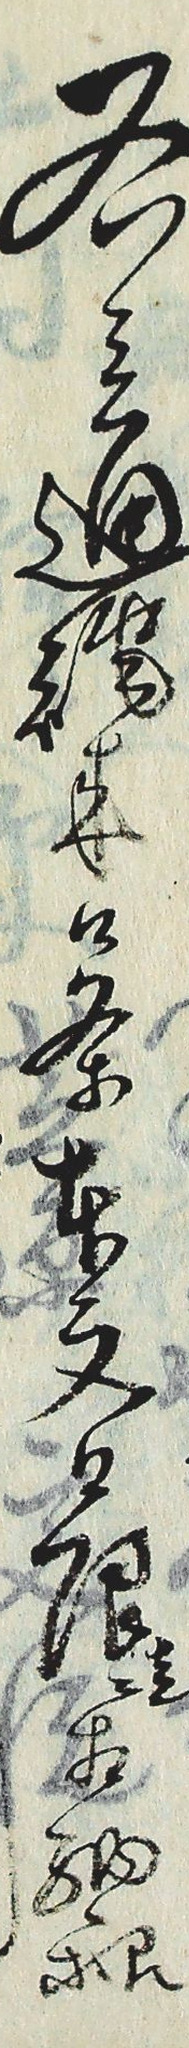右之通誂来候条本文日限迄に相納候様
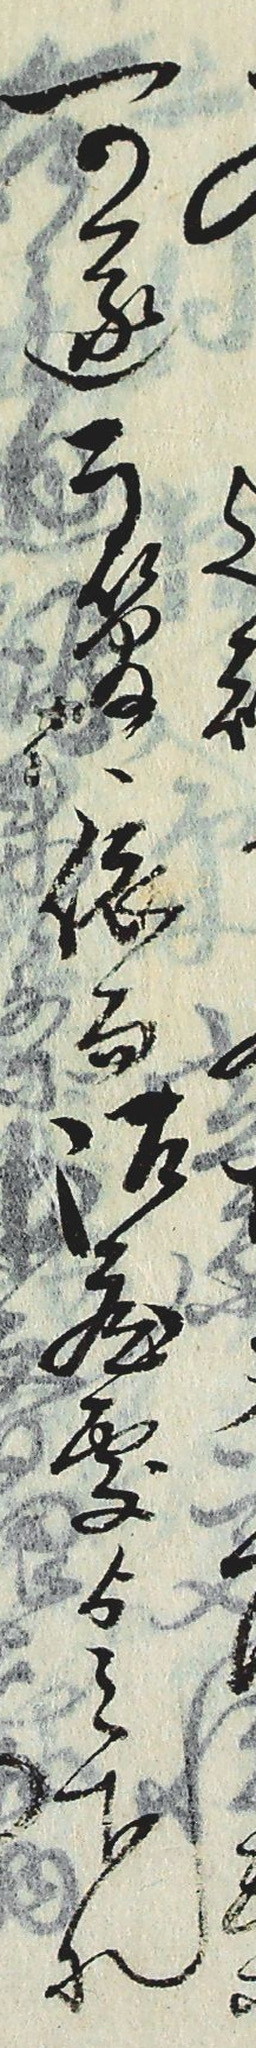可遂了簡候依て御蔵処ゟ之下札
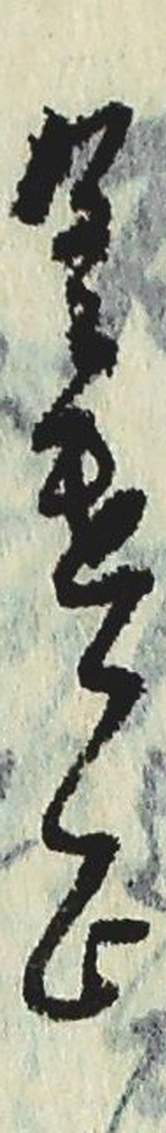差遣候以上
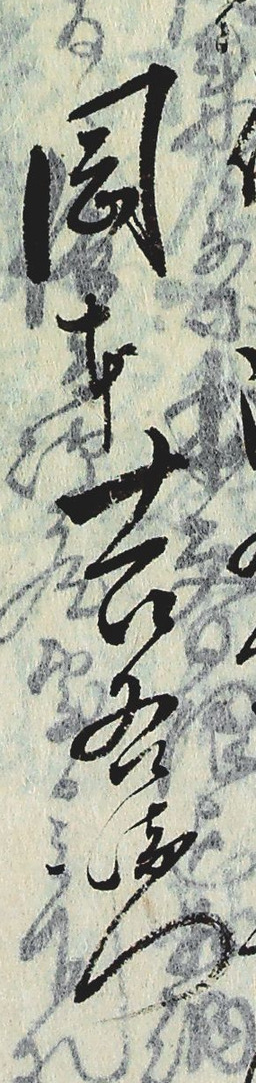岡本吉右衛門
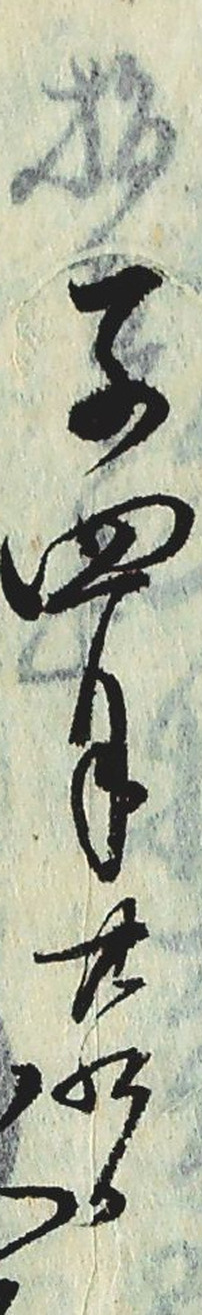子四月廿九日
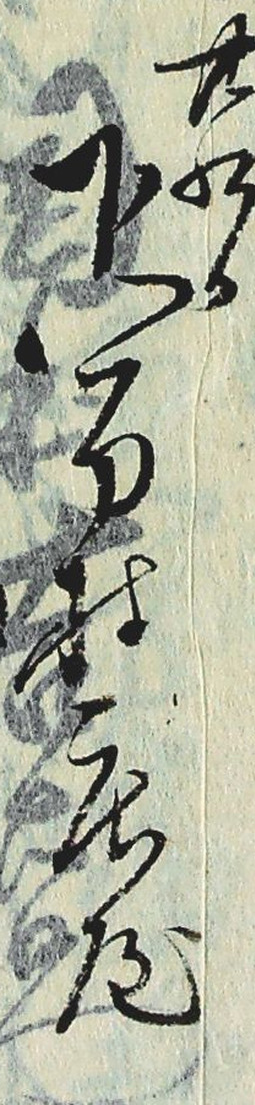下八万村庄屋
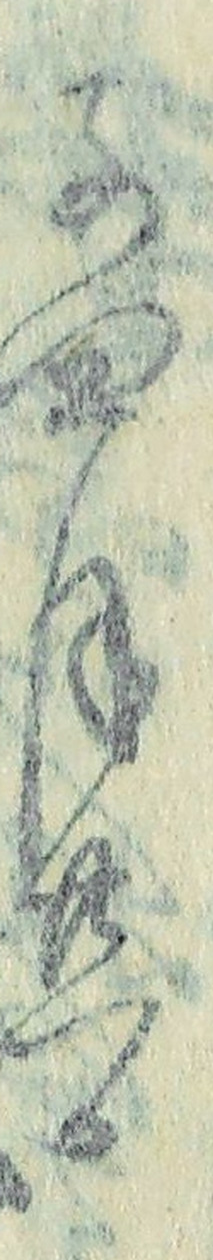子四月廿九日
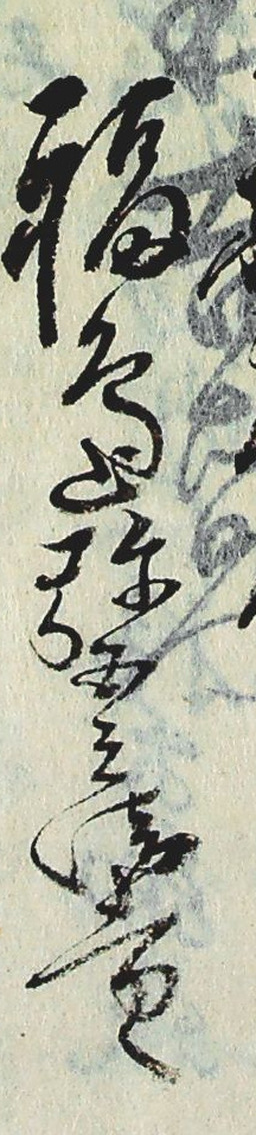福島弥五兵衛方へ
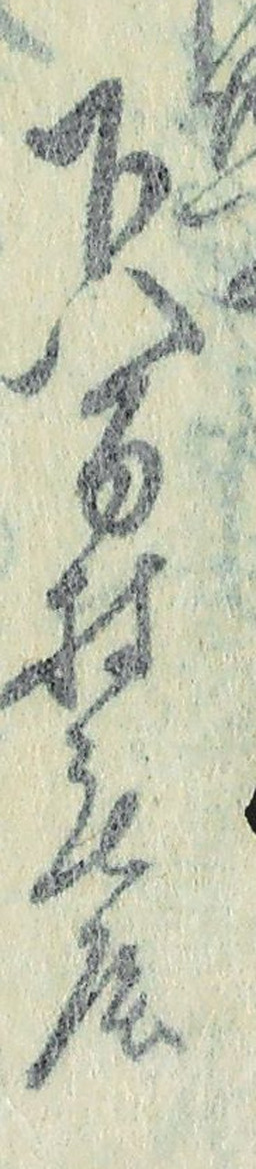下八万村庄屋
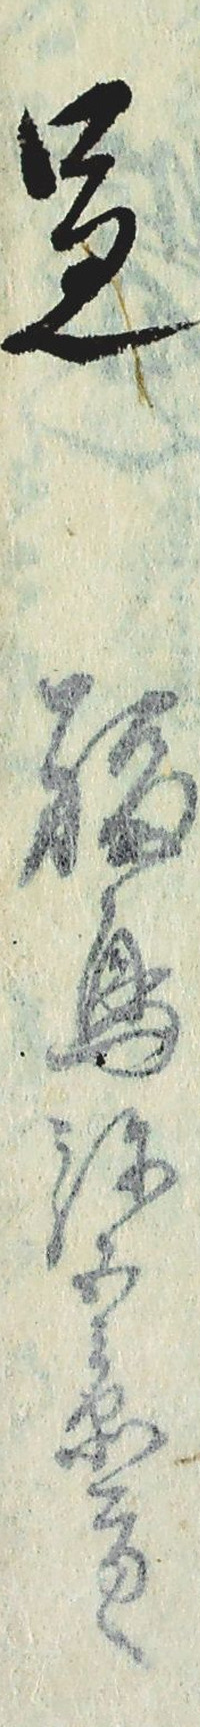福島弥五兵衛方へ
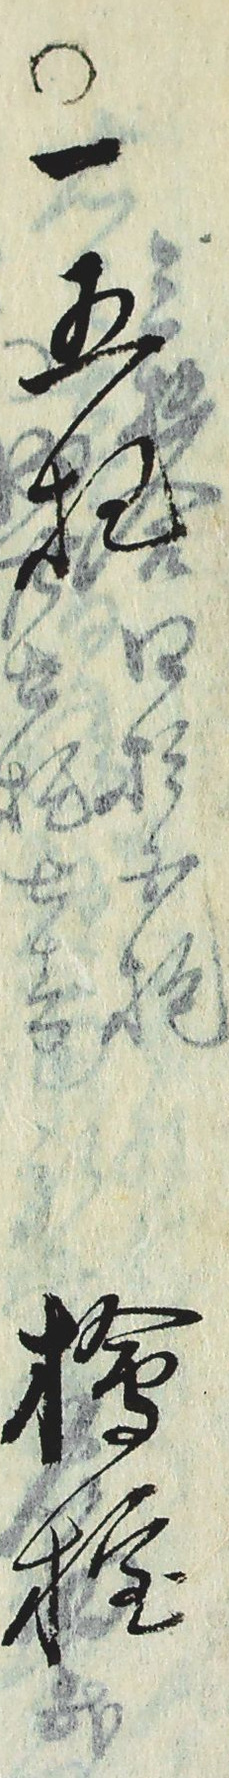一五把桧檀
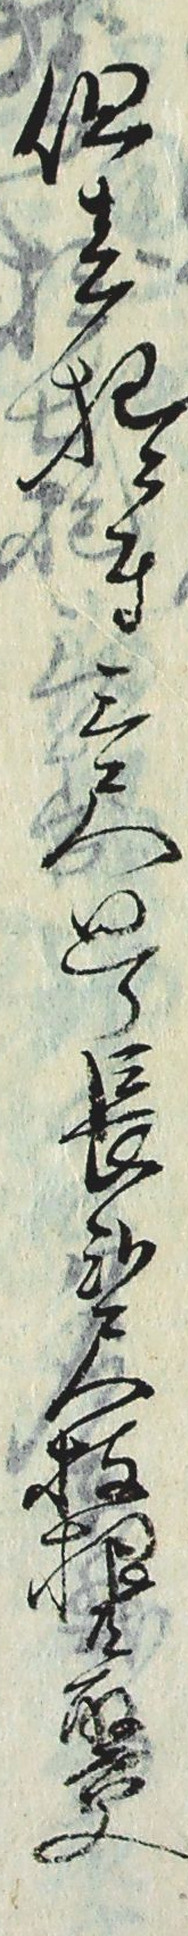但壱把に付三尺廻り長弐尺枝根共取交
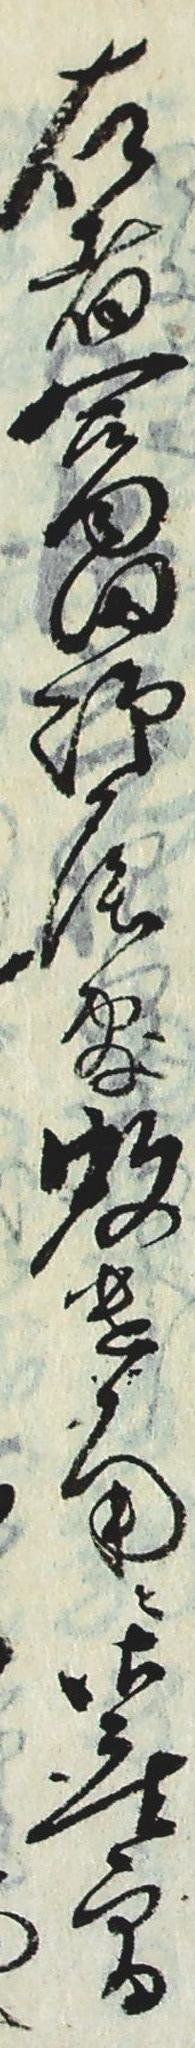右は富田御屋敷蚊遣御用に御座候間
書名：名東郡中諸割賦元帳
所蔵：鳴門教育大学 Naruto University of Education
